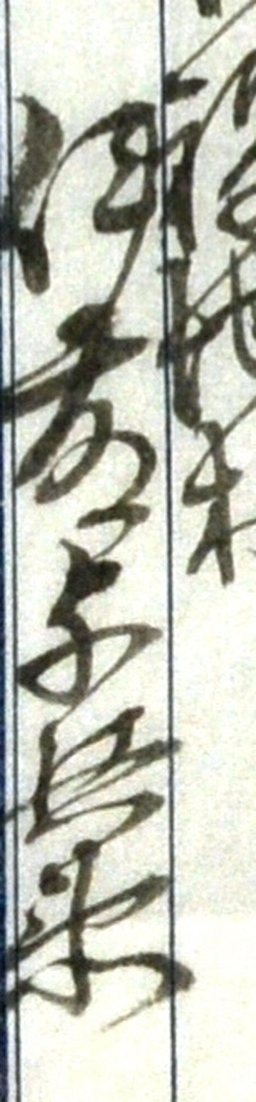伊東与兵衛
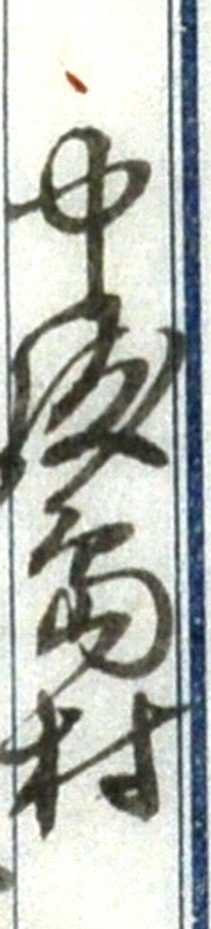中殿島村
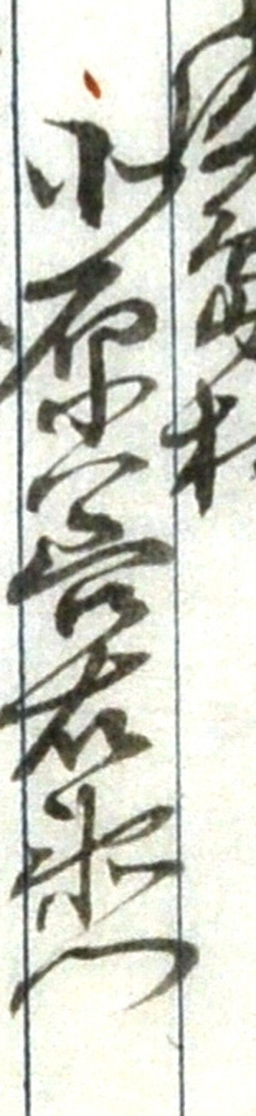北原善右衛門
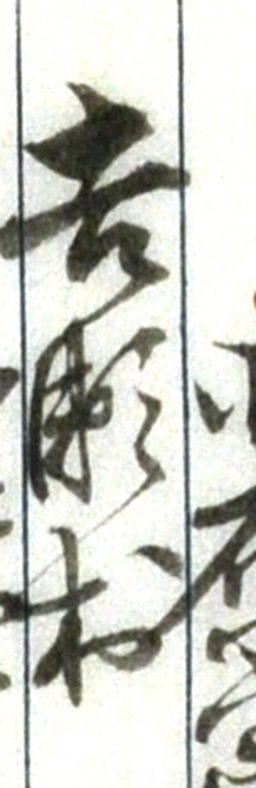吉瀬村
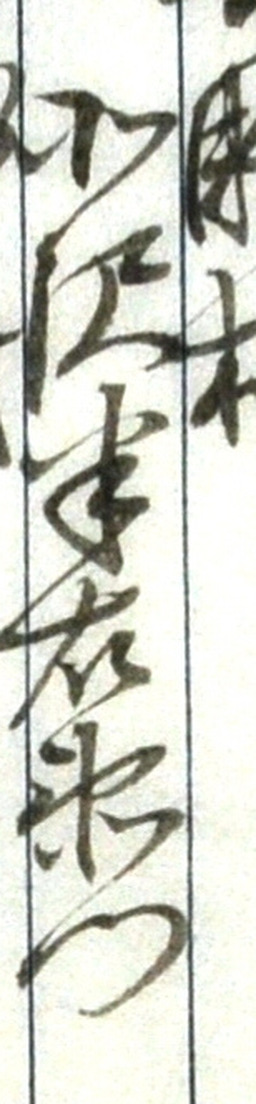北沢半右衛門
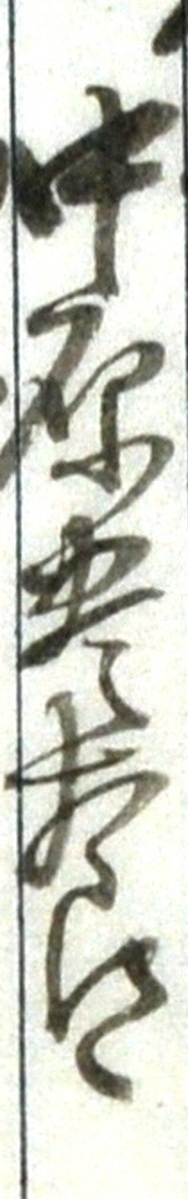北原善右衛門
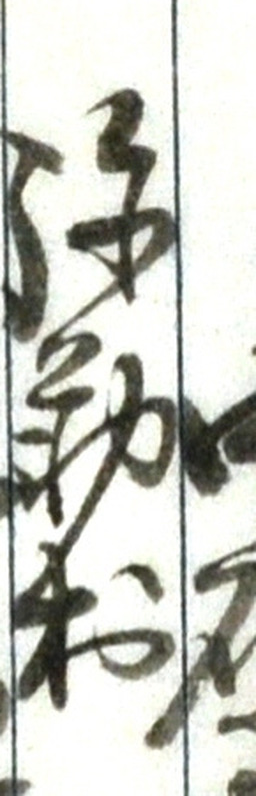弥勒村
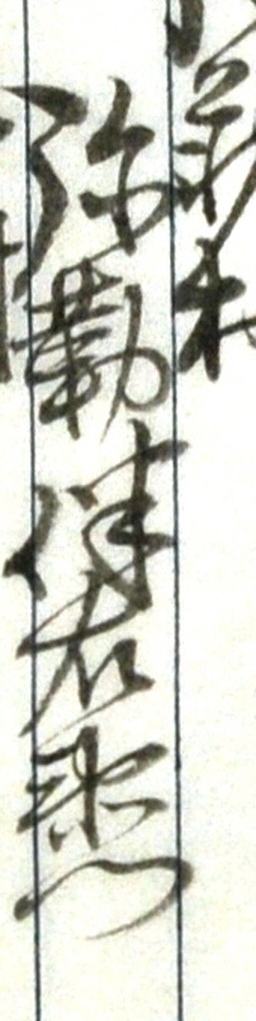弥勒伴右衛門
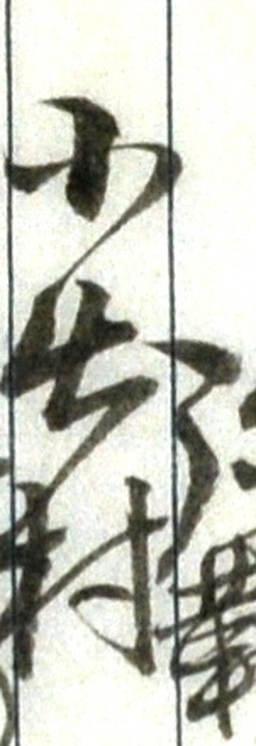小原村
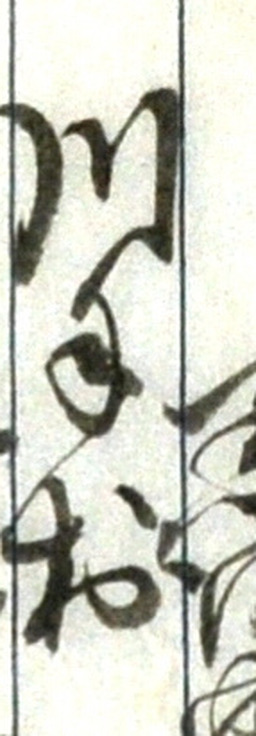川手村
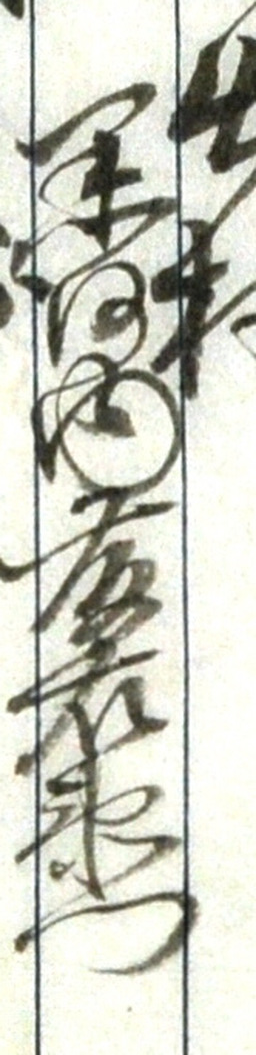黒河内藤右衛門
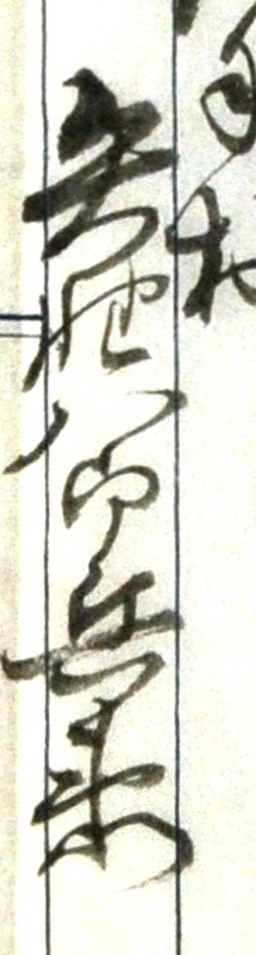矢野八郎兵衛

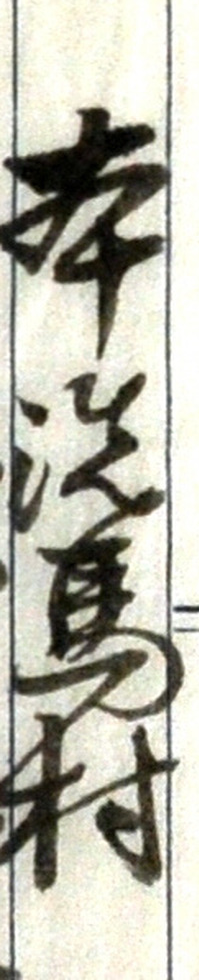本洗馬村
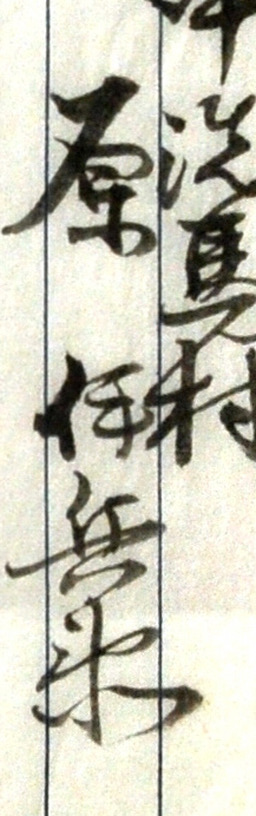原伊兵衛
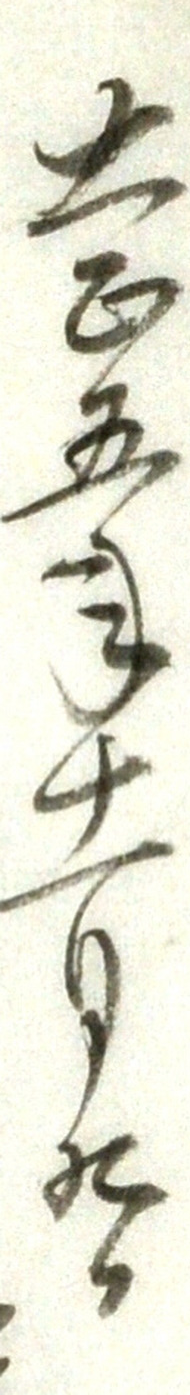大正五年十一月九日
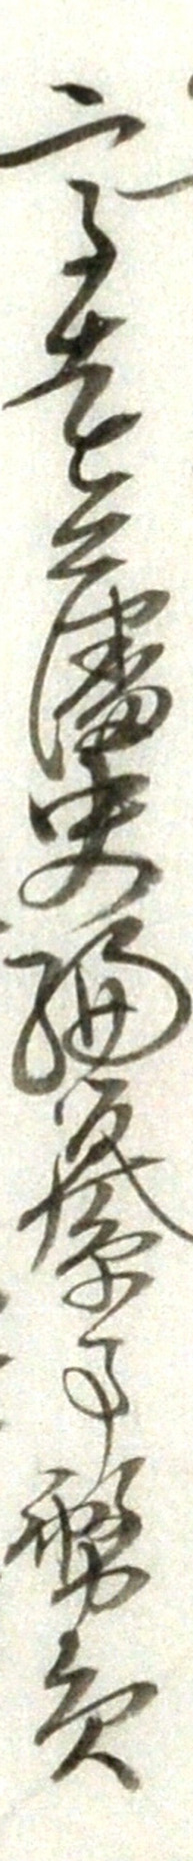高遠藩史編纂事務員
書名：大阪御進初人足数改帳（抄出）
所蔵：伊那市立高遠町図書館・合同会社AMANE
